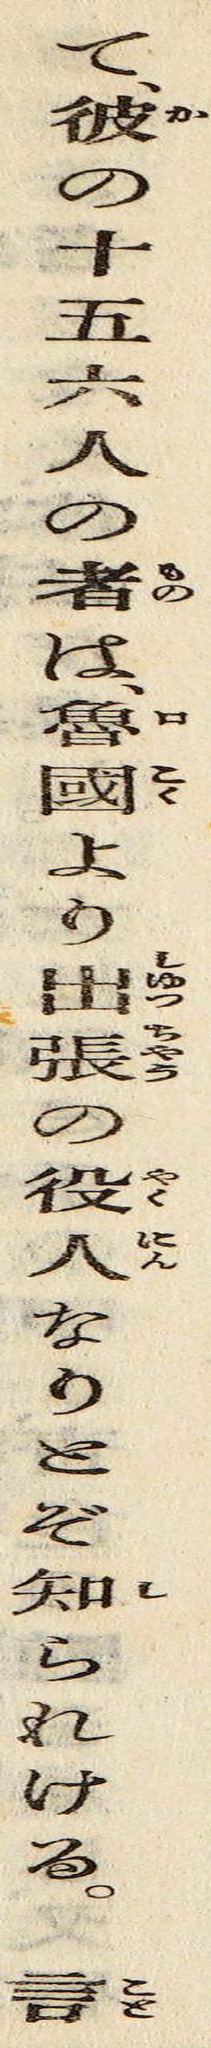て、彼の十五六人の者は、魯国より出張の役人なりとぞ知られける。言
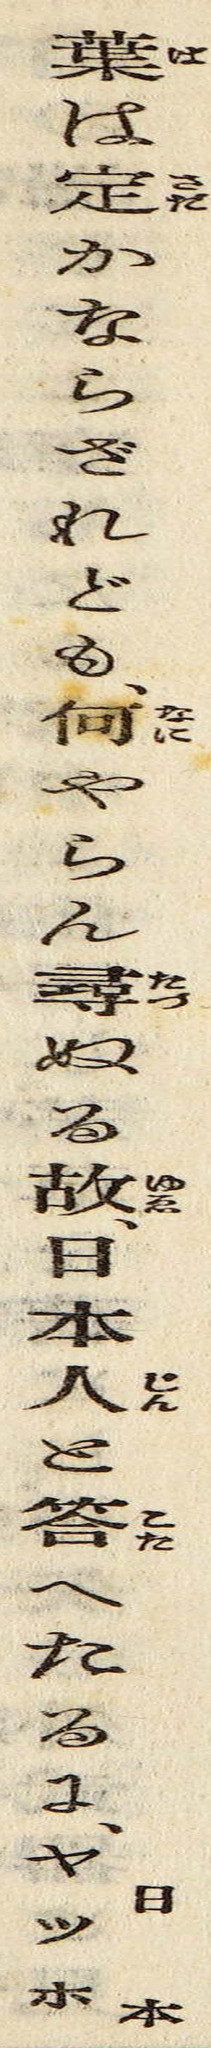葉は定かならざれども、何やらん尋ぬる故、日本人と答へたるに、ヤツホ
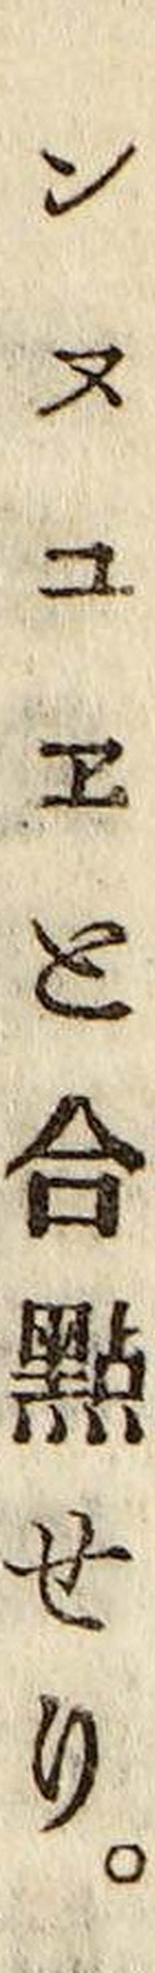ンヌユエと合点せり。

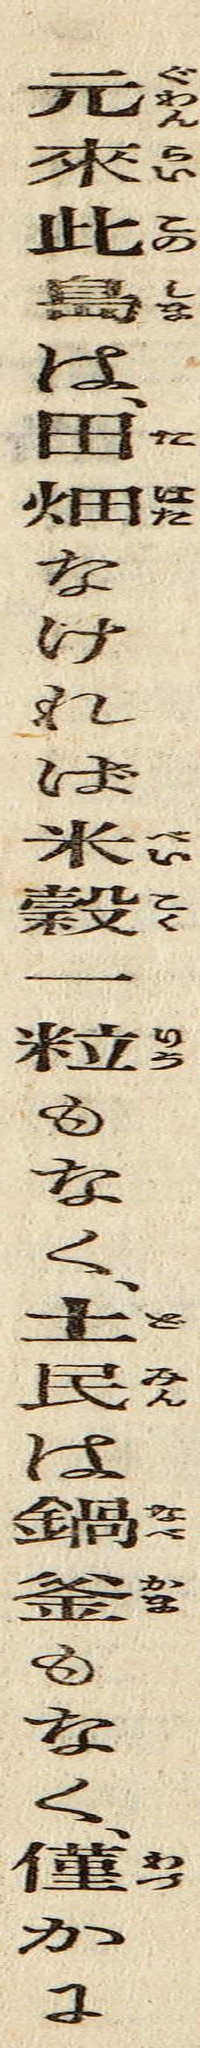元来此島は、田畑なければ米穀一粒もなく、土民は鍋釜もなく、僅かに
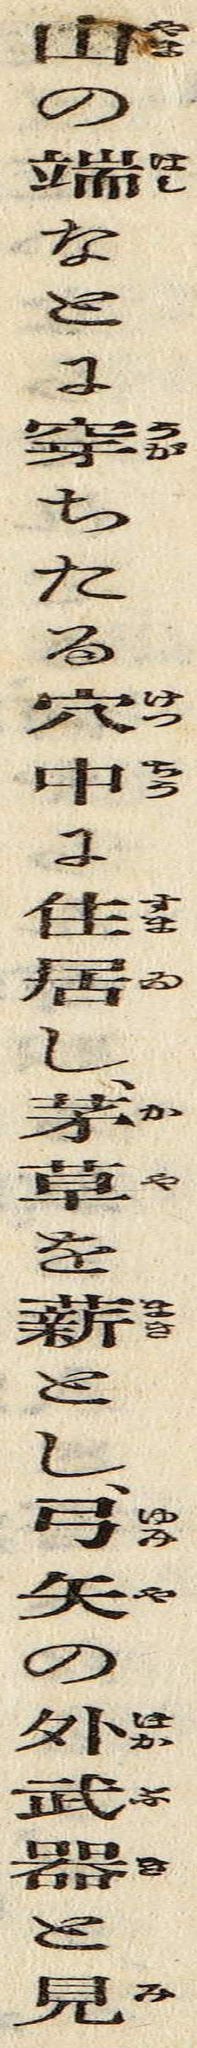山の端なとに穿ちたる穴中に住居し、茅草を薪とし、弓矢の外武器と見
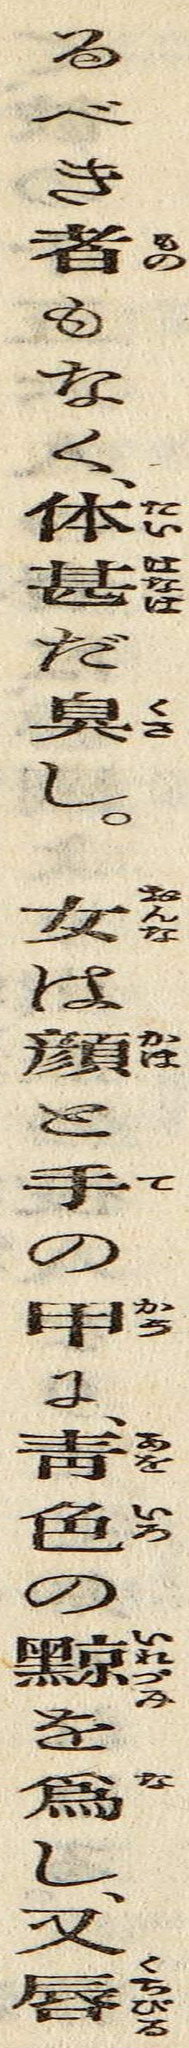るべき者もなく、体甚だ臭し。女は顔と手の甲に、青色の黥を為し、唇
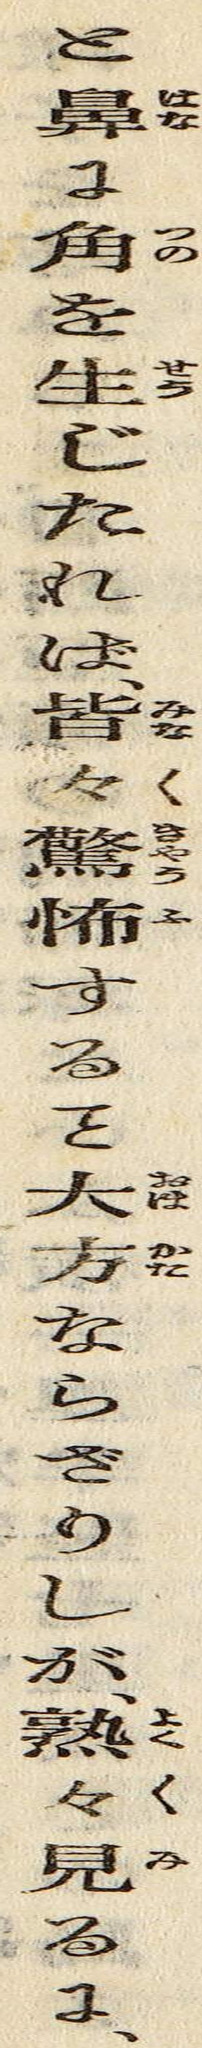と鼻に角を生じたれば、皆々恐怖すること大方ならざりしが、熟々見るに、
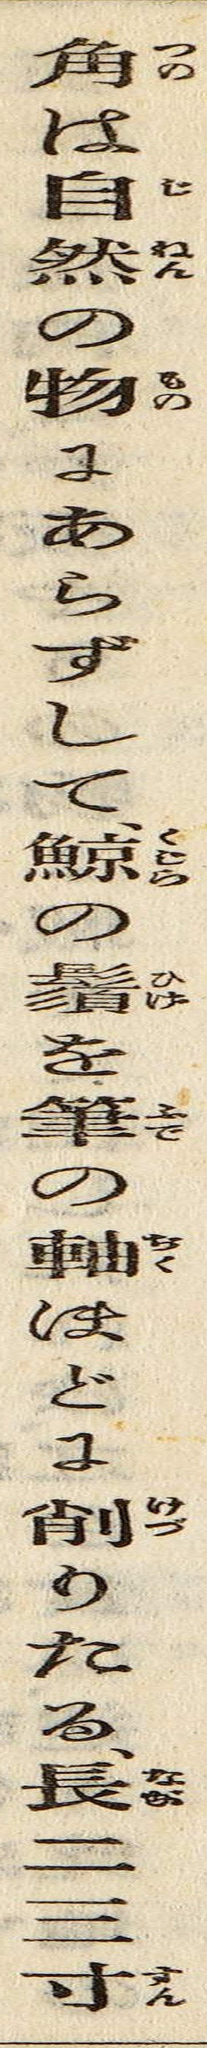角は自然の物にあらずして、鯨の鬚を筆の軸ほどに削りたる、長二三寸
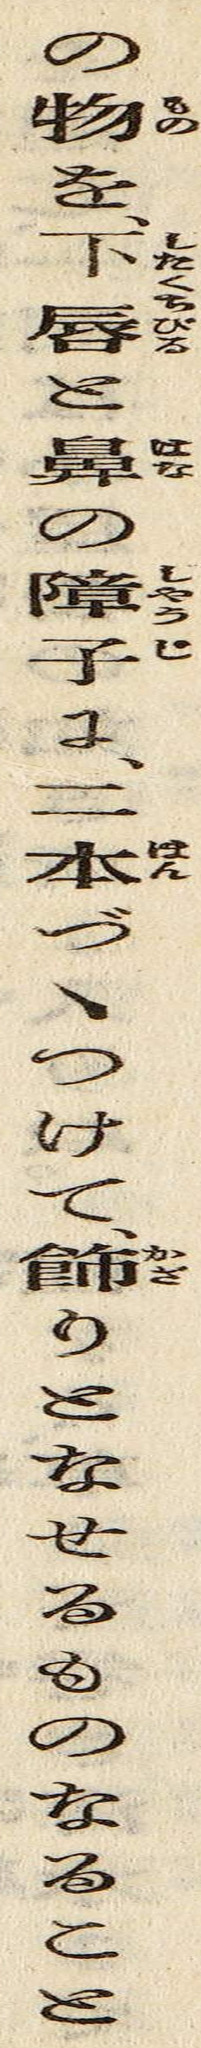の物を、下唇と鼻の障子に、二本づゝつけて、飾りとなせるものなること
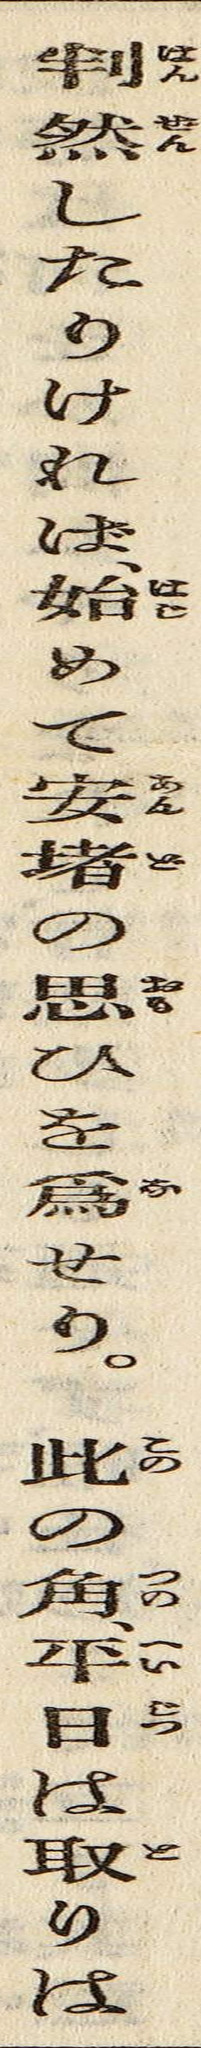判然したりければ、始めて安堵の思ひを為せり。此の角、平日は取りは
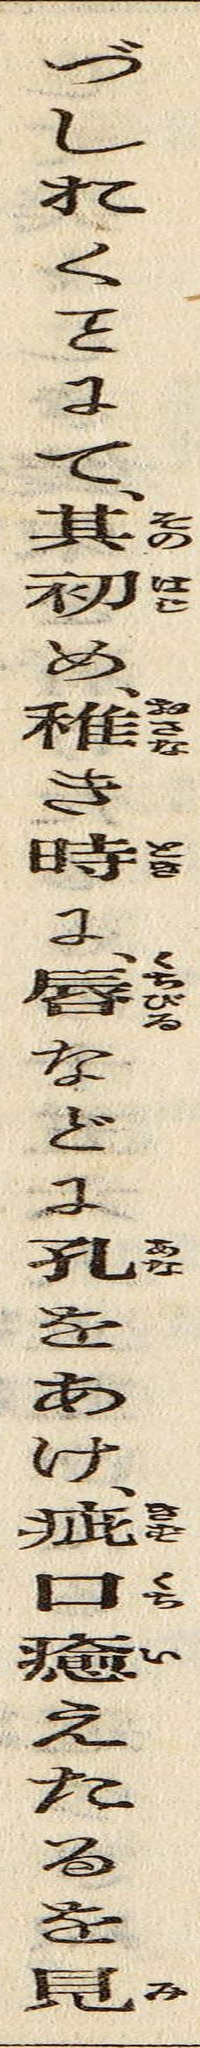づしおくことにて、其初め、稚き時に、唇などに孔をあけ、疵口癒えたるを見
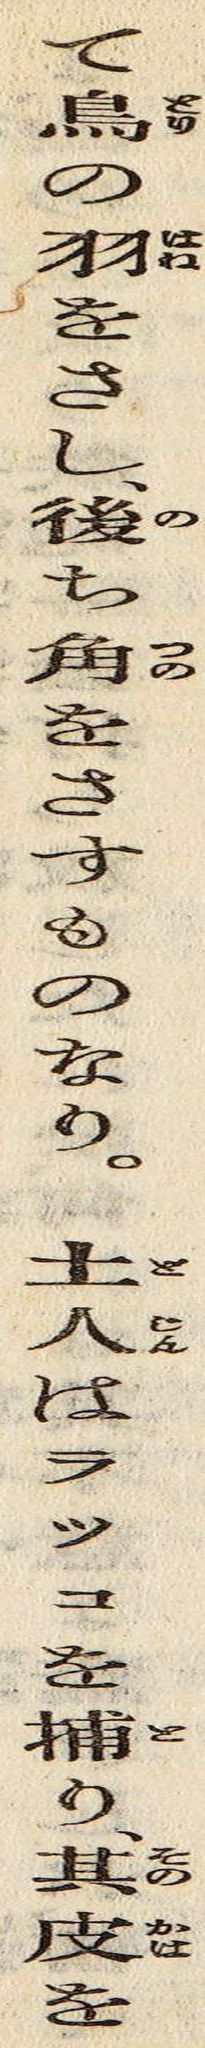て鳥の羽をさし、後ち角をさすものなり。土人はラツコを捕り、其皮を
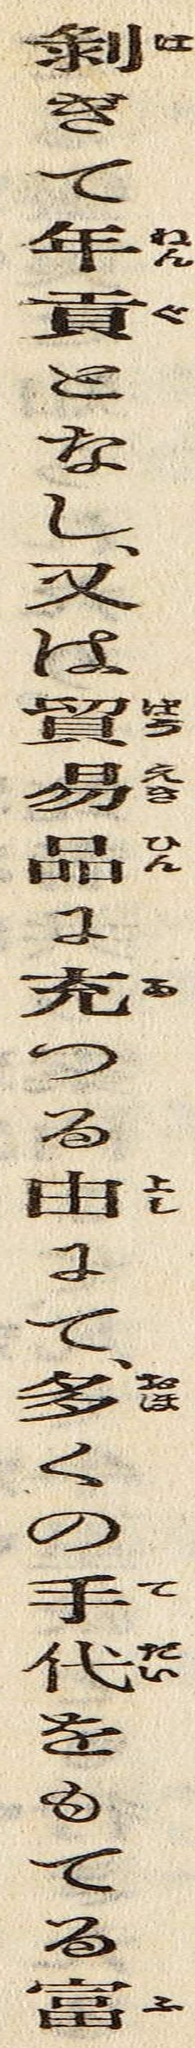剥ぎて年貢となし、又は貿易品に充つる由にて、多くの手代をもてる富
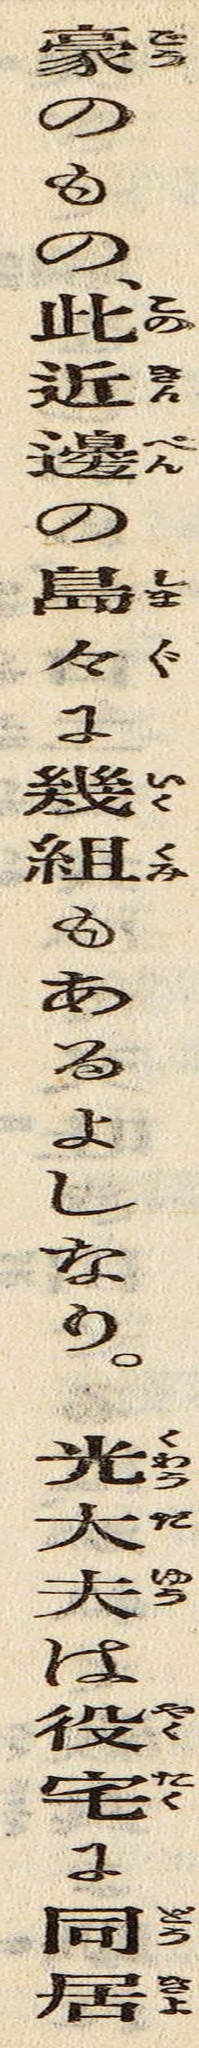豪のもの、此近辺の島々に幾組もあるよしなり。光大夫は役宅に同居
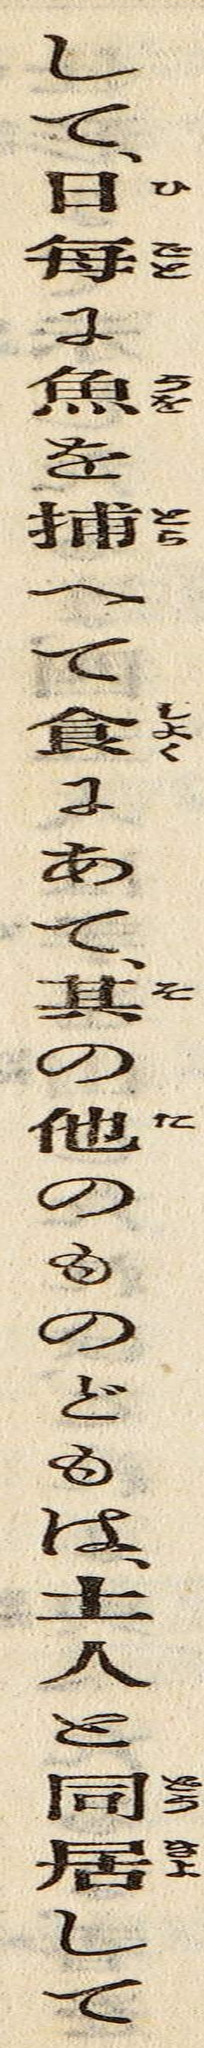して、日毎に魚捕へて食にあて、其の他のものどもは、土人と同居して
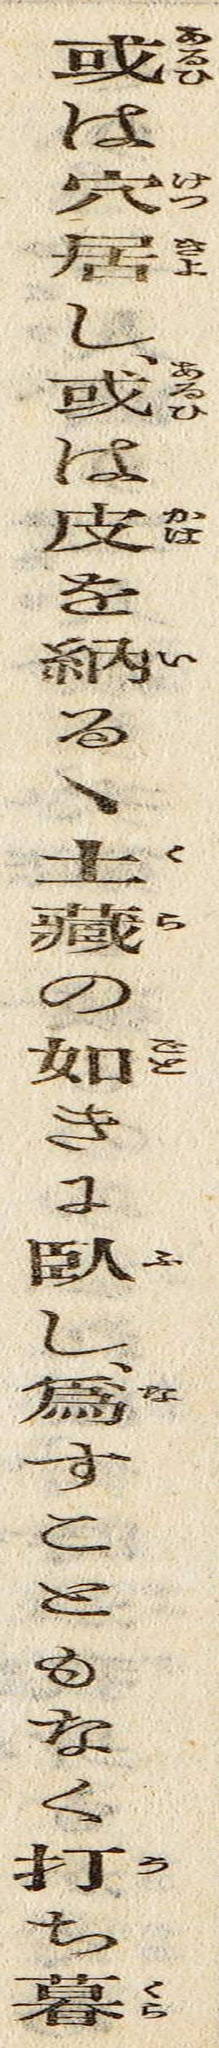或は穴居し、或は皮を納る土蔵の如きに臥し、為すこともなく打ち暮
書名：日本漂流譚
